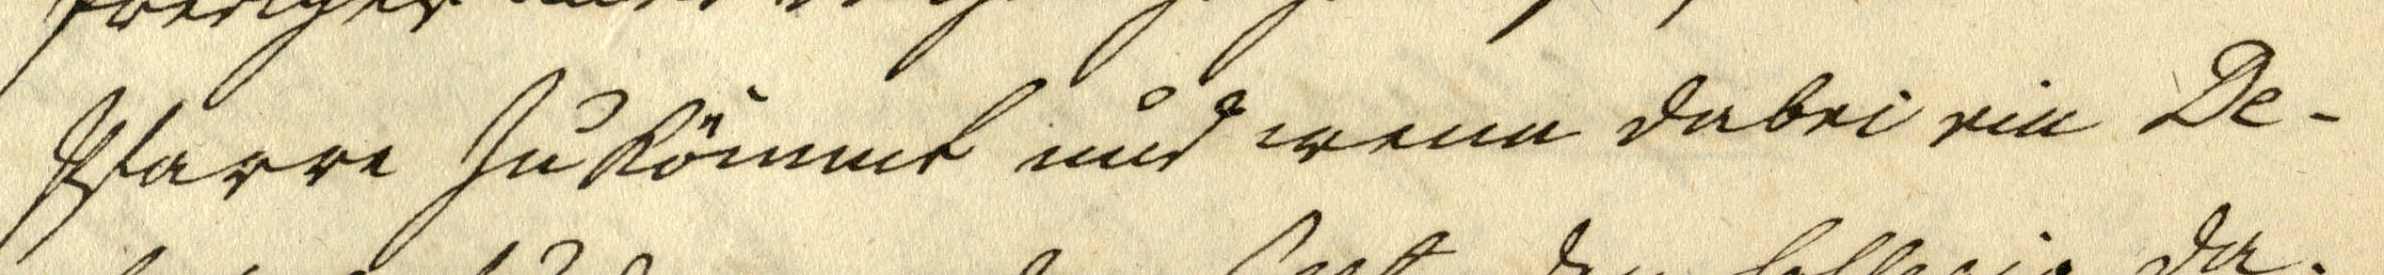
Pfarre zukömmt und wenn dabei ein De-
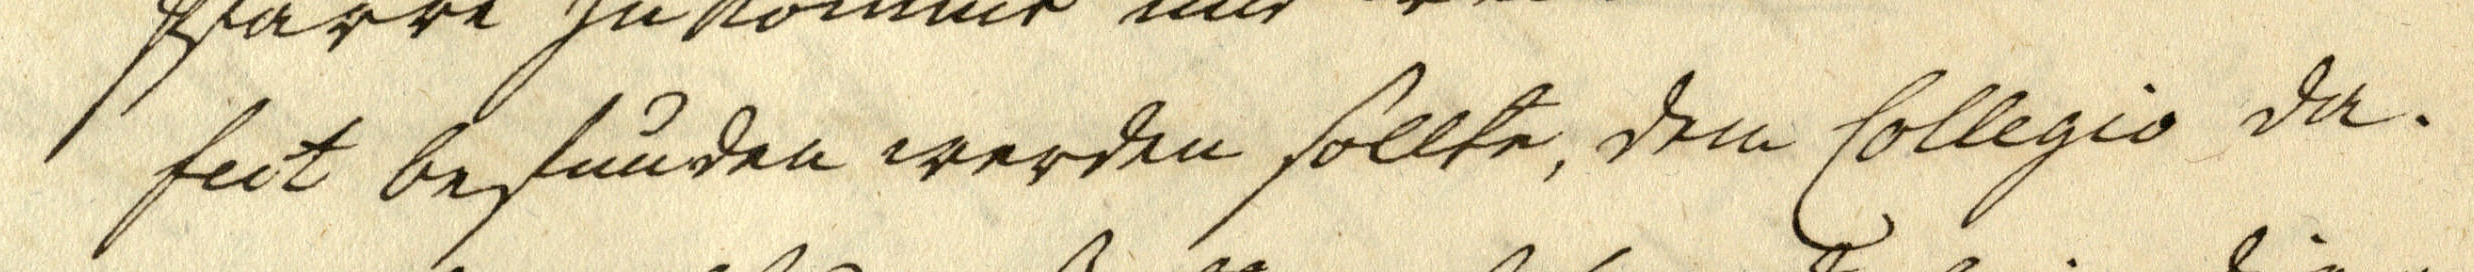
fect befunden werden sollte, dem Collegio da-
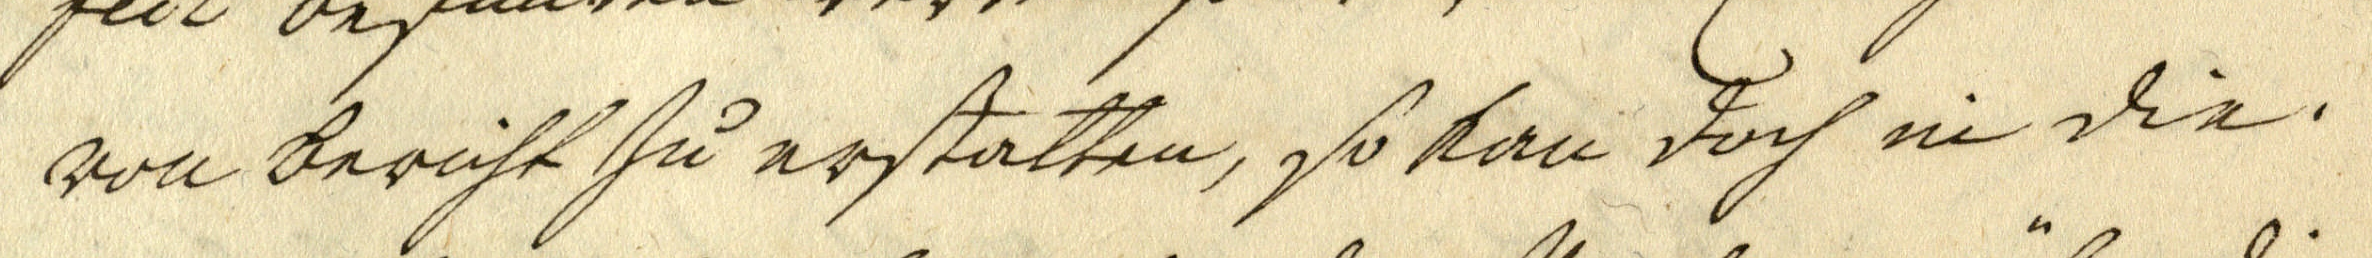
von Bericht zu erstatten, so kan doch in die-
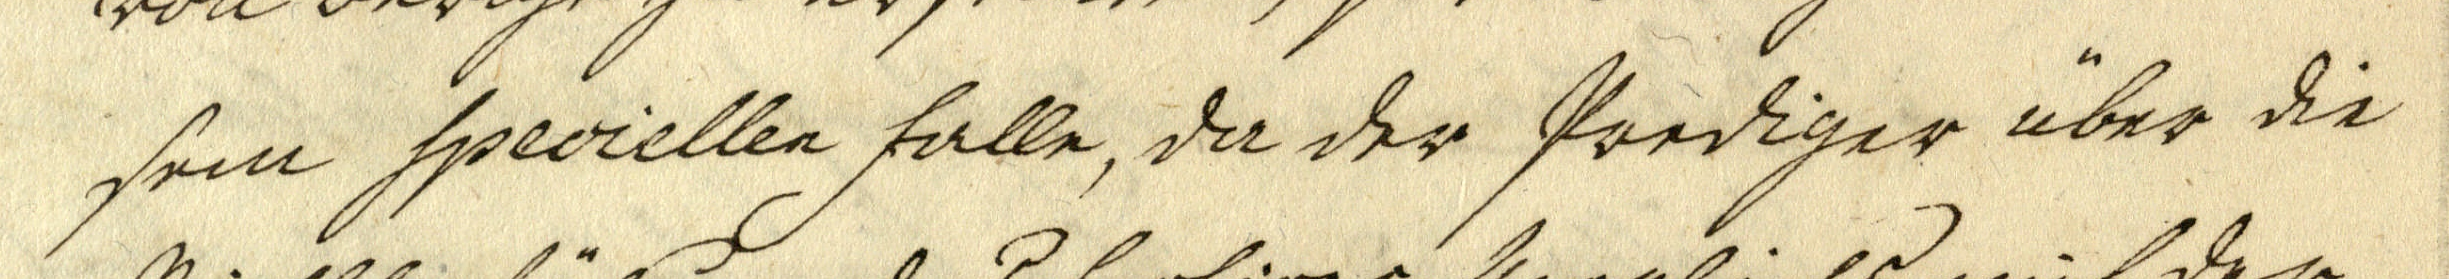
sem speciellen Falle, da der Prediger über die
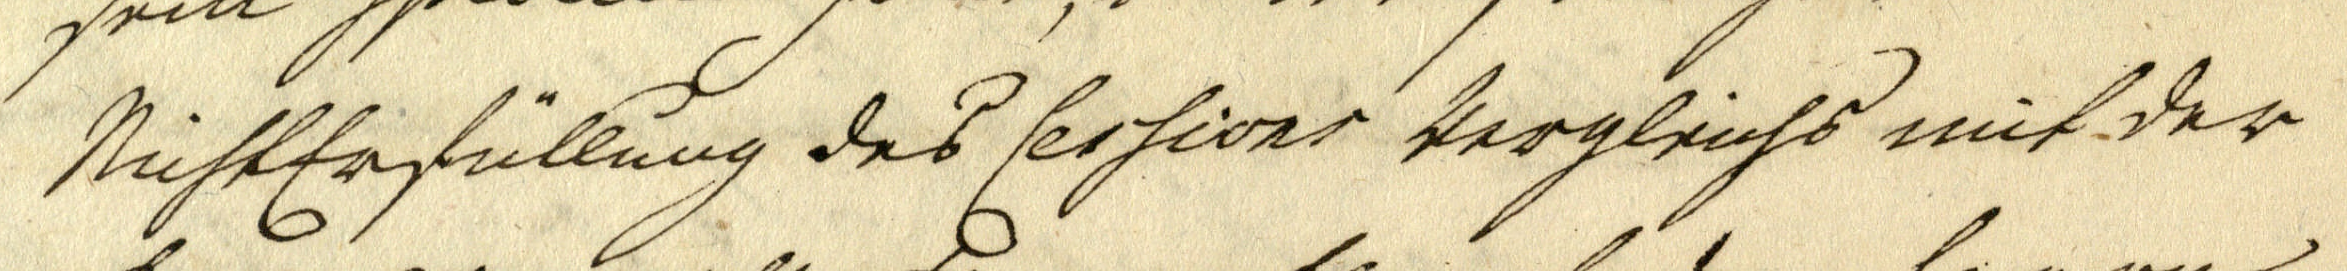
Nicht Erfüllung des Cessions Vergleichs mit der
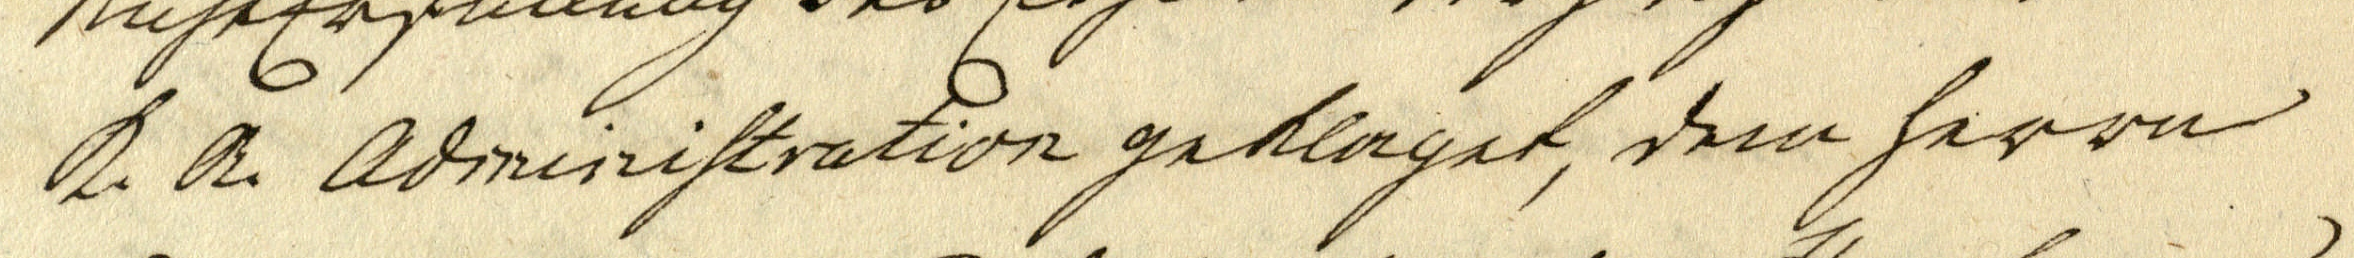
K. A. Administration geklaget, dem herrn
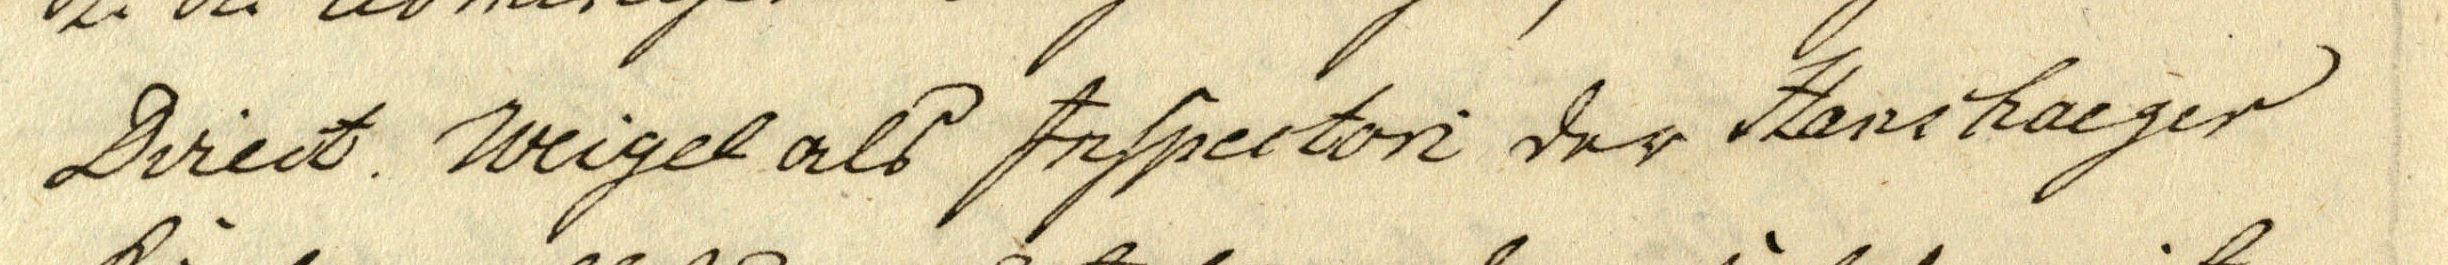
Direct. Weigel als Inspectori der Hanshaeger
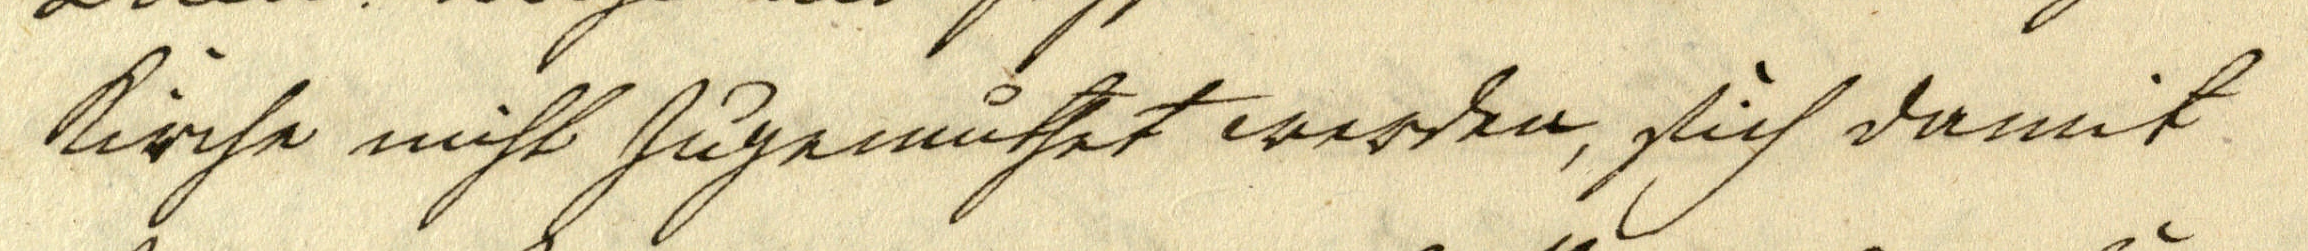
Kirche nicht zugemuthet werden, sich damit
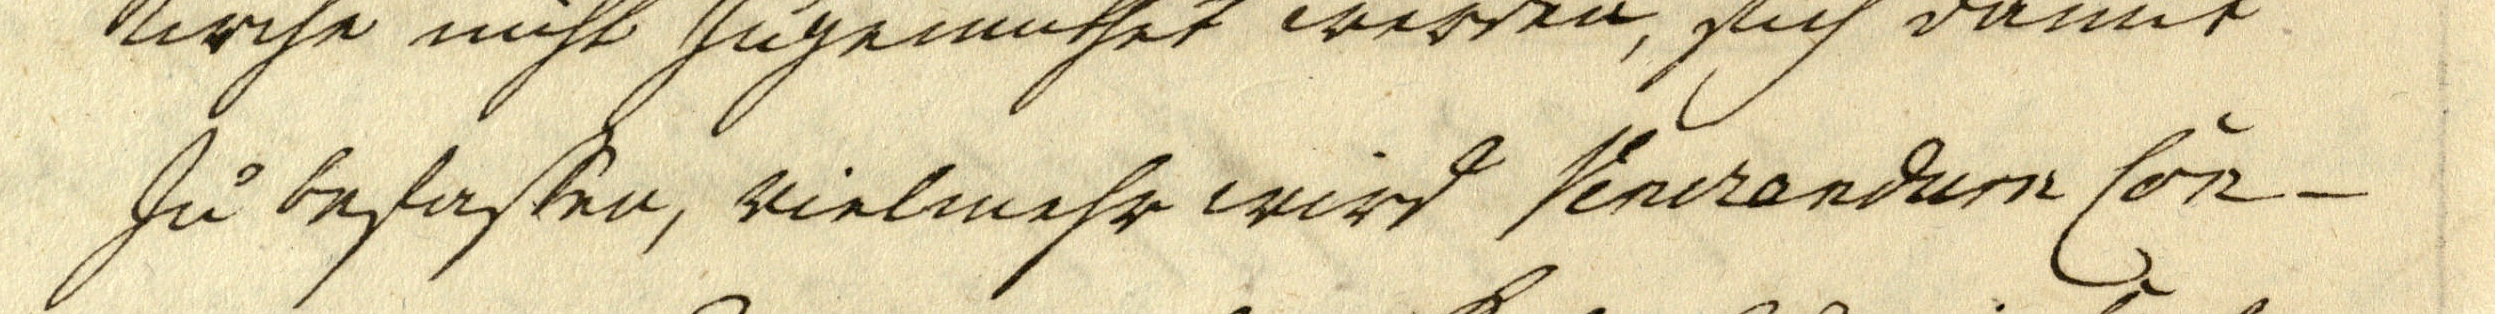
zu befassen, vielmehr wird Venerandum Con-
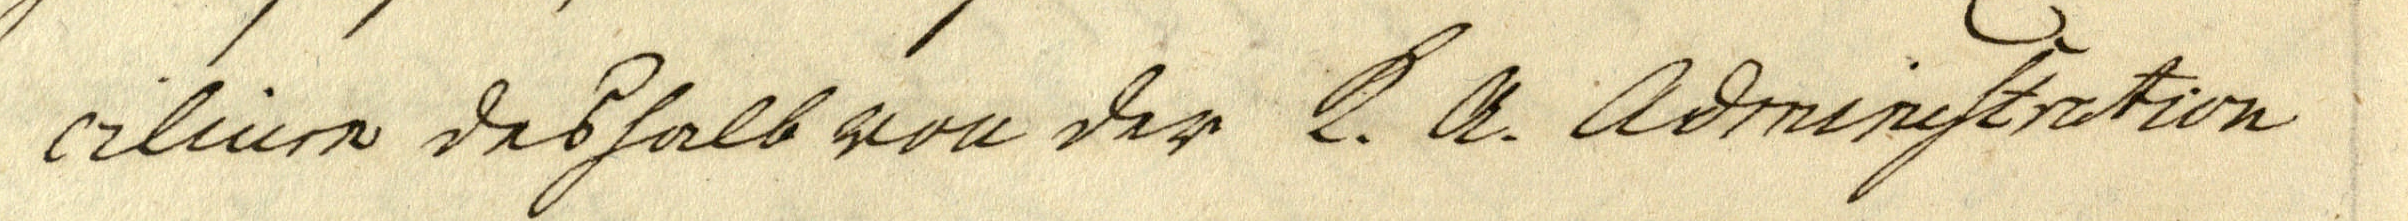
cilium deshalb von der K. A. Administration
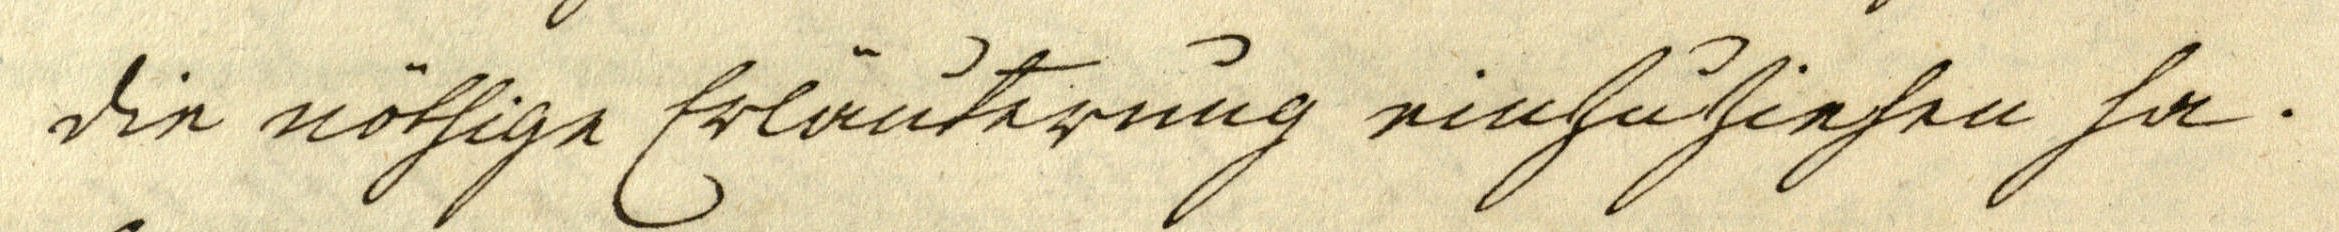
die nöthige Erläuterung einzuziehen ha-
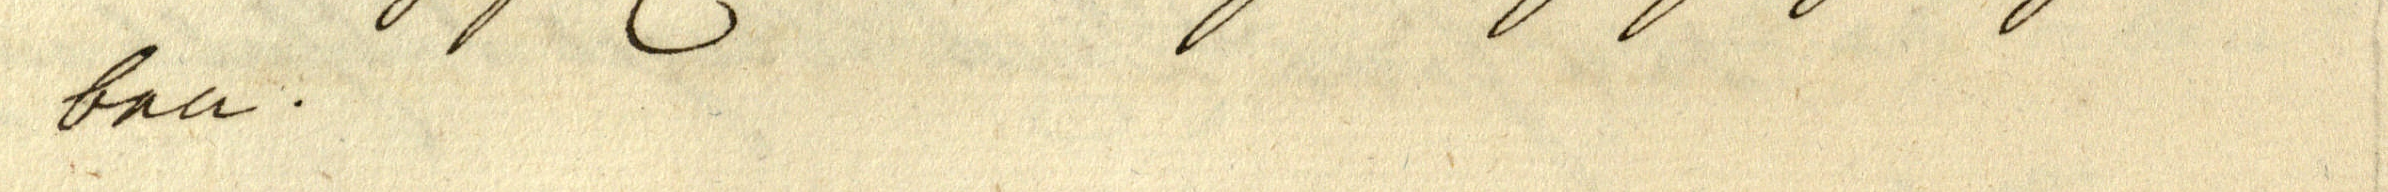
ben.
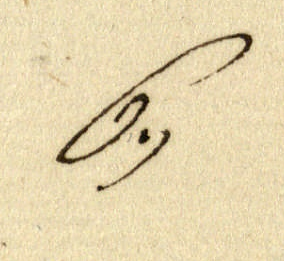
6.,
